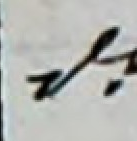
do
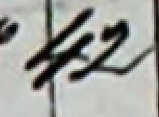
42
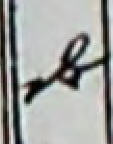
do
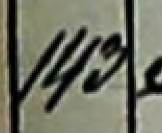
143
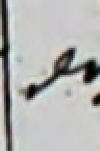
do
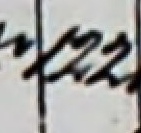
122
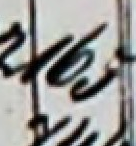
165
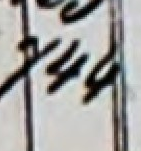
744
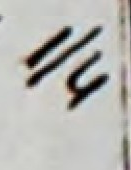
1/4
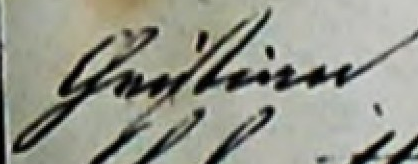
Christian
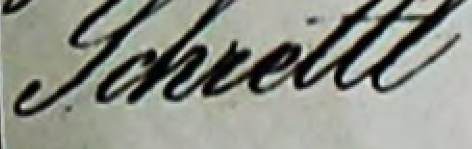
Schrettl
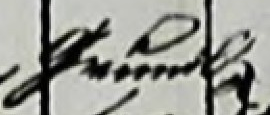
Grund„
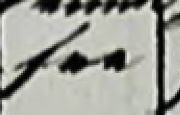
fer
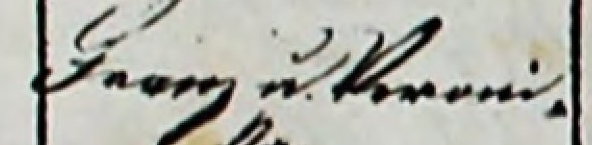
Franz u. Veroni„
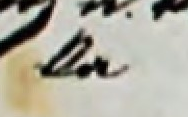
ka
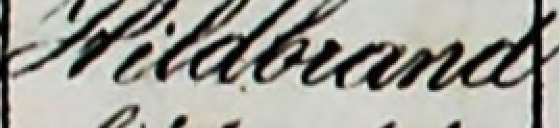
Hildbrand
